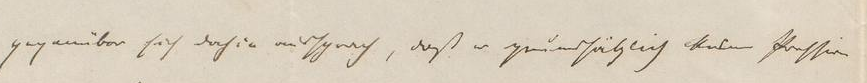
gegenüber sich dahin aussprach, daß er grundsätzlich keine Pression
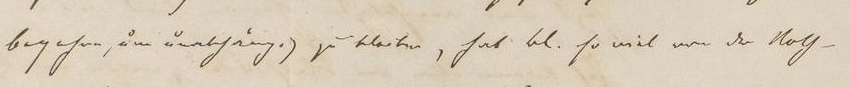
begehre, um unabhängig zu bleiben, hat Bl. so viel von der Noth-
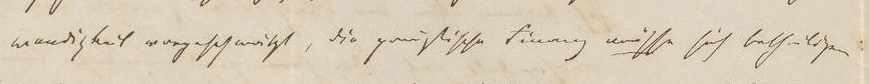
wendigkeit vorgeschwätzt, die preußische Finanz müsse sich betheiligen
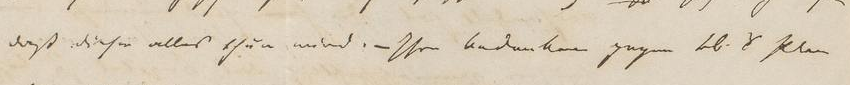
daß dieser alles thun wird. – Ihre Bedenken gegen Bl.'s u Plan
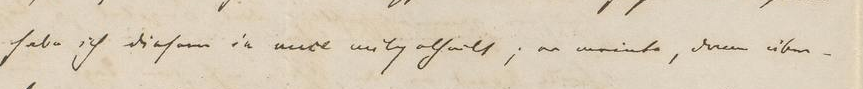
habe ich diesem in nuce mitgetheilt; er meinte, dann über-
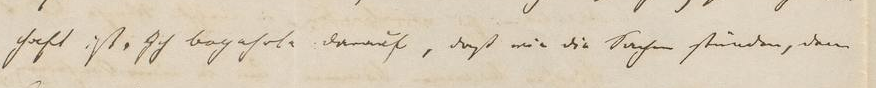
haft ist. Ich begehrte darauf, daß wie die Sachen stünden, dem
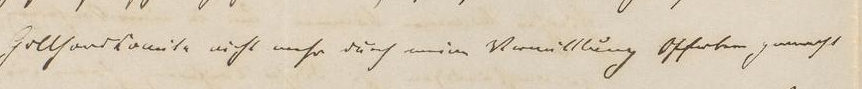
GotthardComite nicht mehr durch meine Vermittlung Offerten gemacht
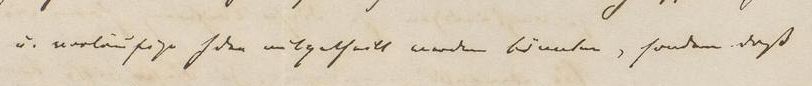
u. vorläufige Idee mitgetheilt werden könnten, sondern daß
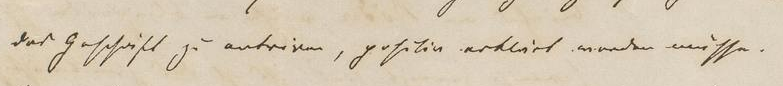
das Geschäft zu ...triren, positiv erklärt werden müsse.
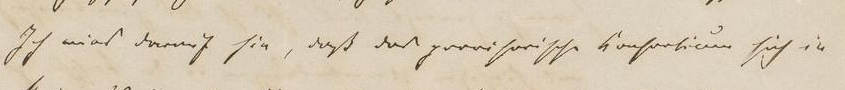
Ich wies darauf hin, daß das provisorische Consortium sich in
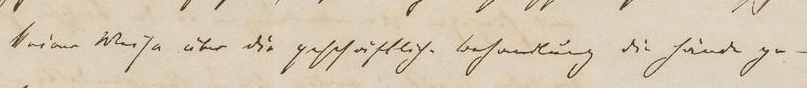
keiner Weise über die geschäftliche Behandlung die Hände ge-
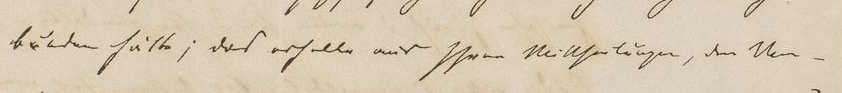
bunden hätte; das erhalte aus Ihren Mittheilungen, den Ver-
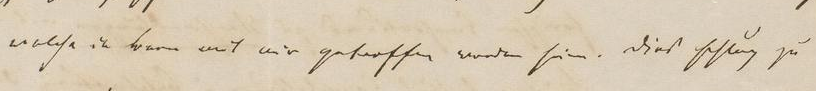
welche in Bern mit mir getroffen worden sein. Dies schlug zu
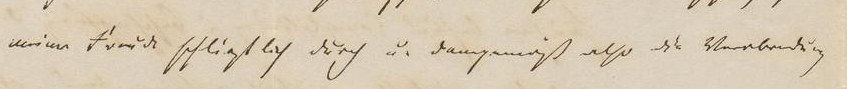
meiner Freude schließlich durch u. demgemäß also die Verabredung
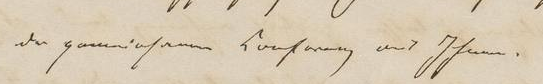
der gemeinsamen Conferenz mit Ihnen.
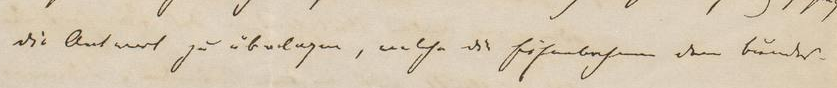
die Antwort zu überlegen, welche die Eisenbahnen dem Bundes-
